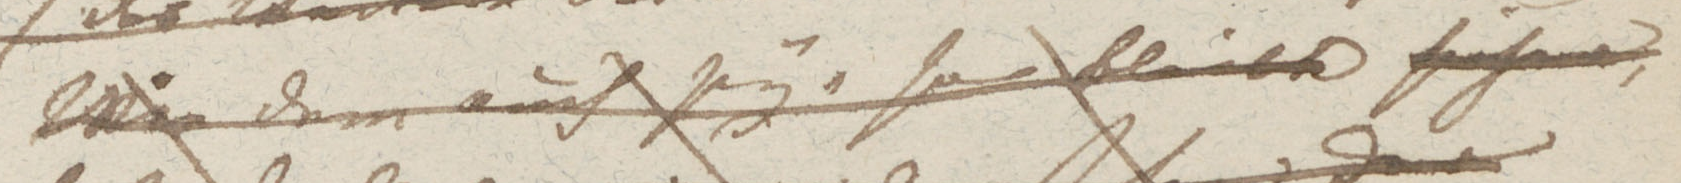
Wie dem auch sey so bleibt sicher,
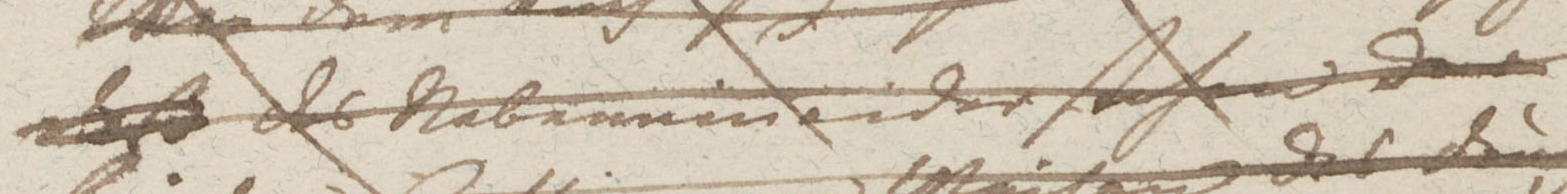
dass das Nebeneinanderstehen der
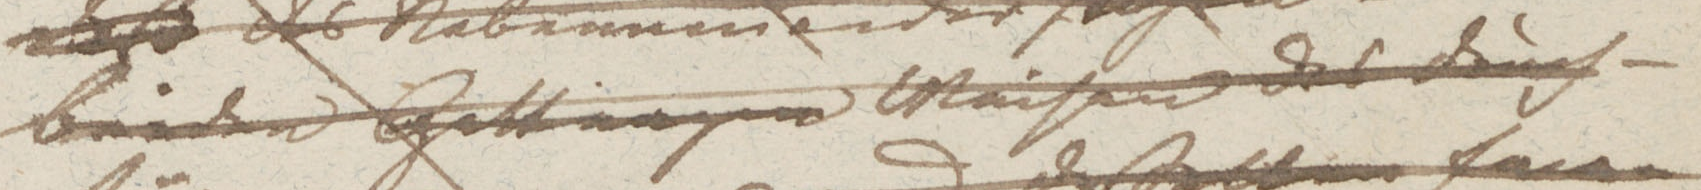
beiden Gattungen Weisen des Durch-
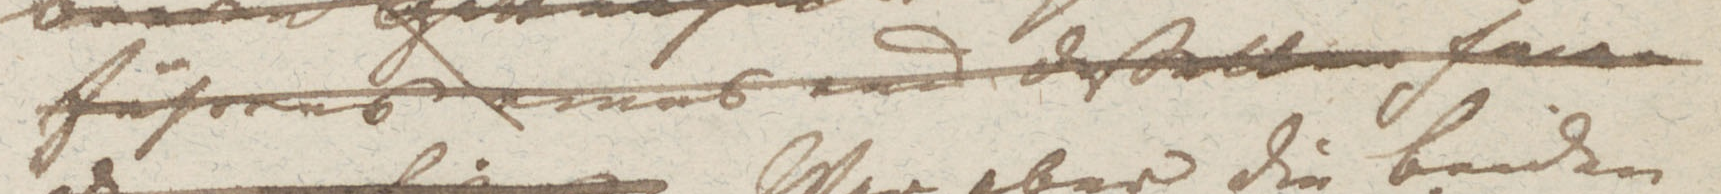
führens eines und desselben Faca-
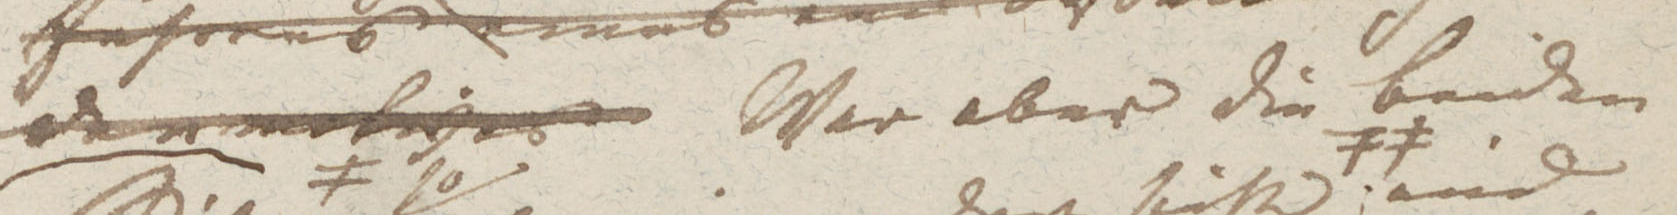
denmotives Wer aber die beiden
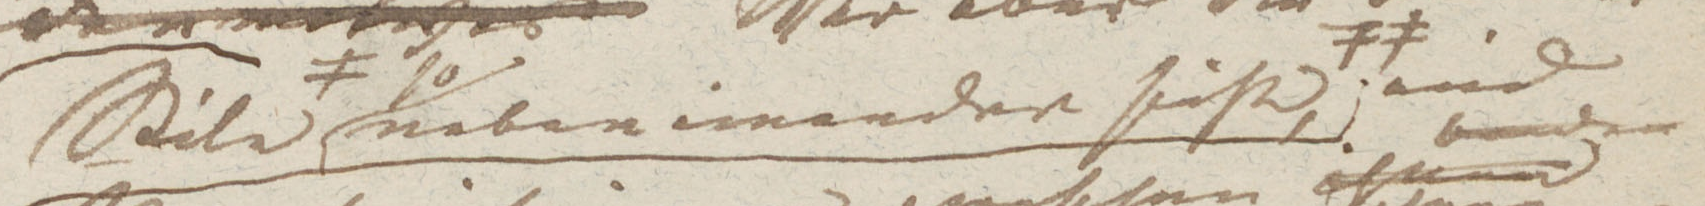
Stile % so neben einander sieht, % und
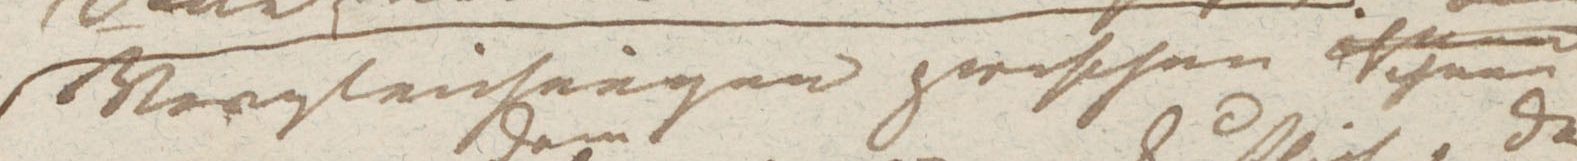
Vergleichungen zwischen ihnen beiden
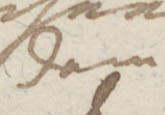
ihnen
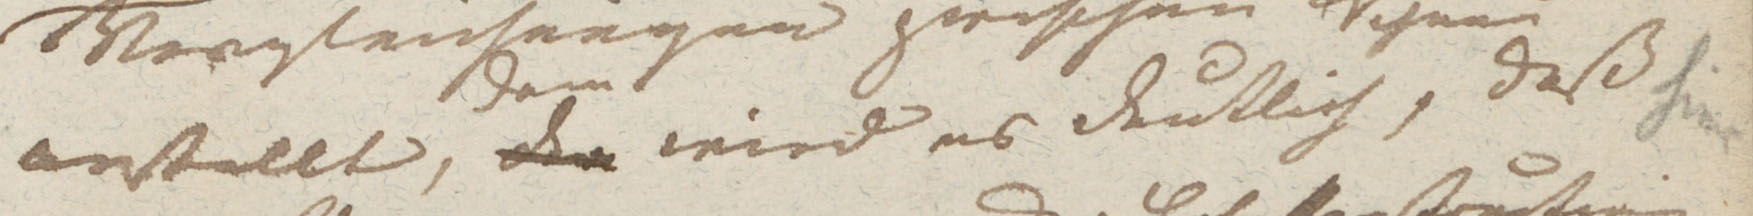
anstellt, der dem wird es deutlich, dass hier
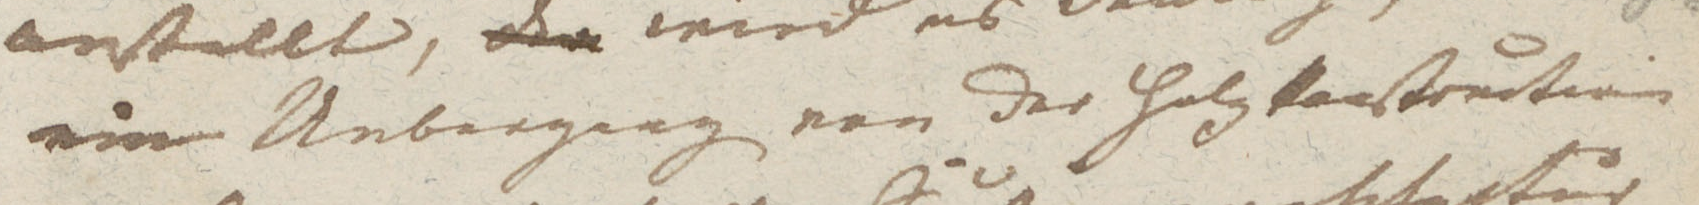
ein Uebergang von der Holzkonstruction
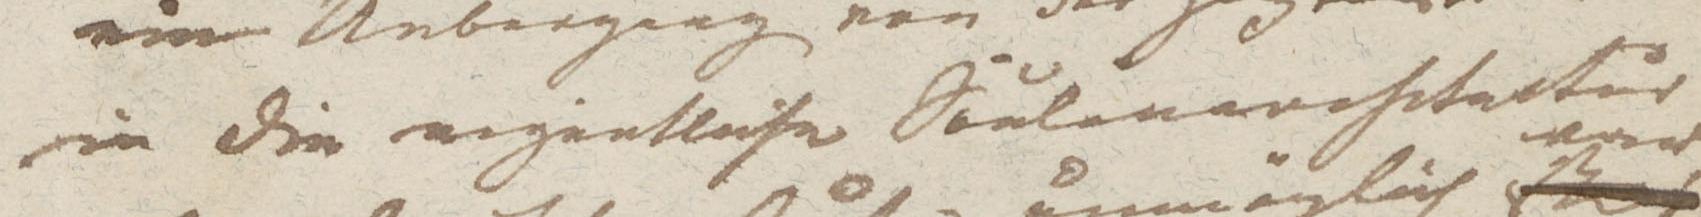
in die eigentliche Säulenarchitectur
